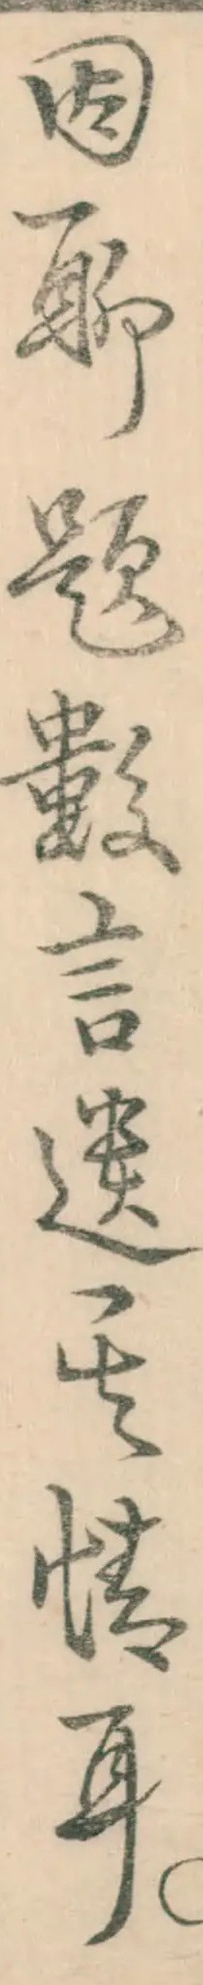因聊題数言遺其情耳。
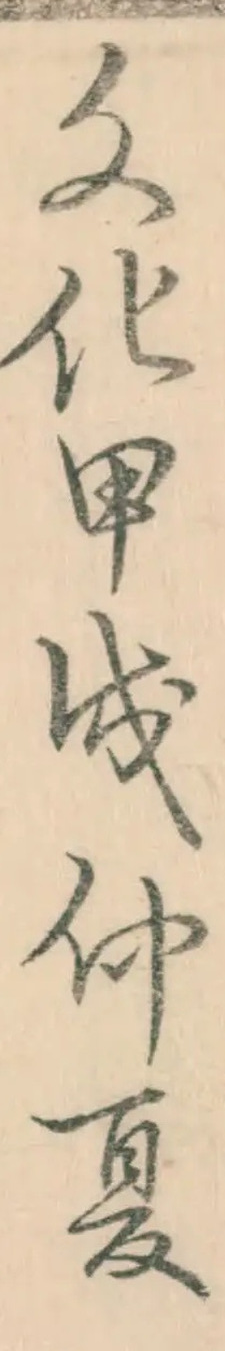文化甲戌仲夏
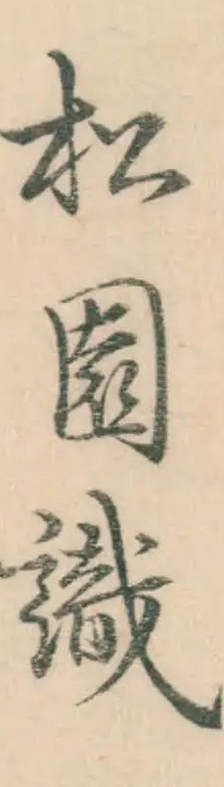松園識
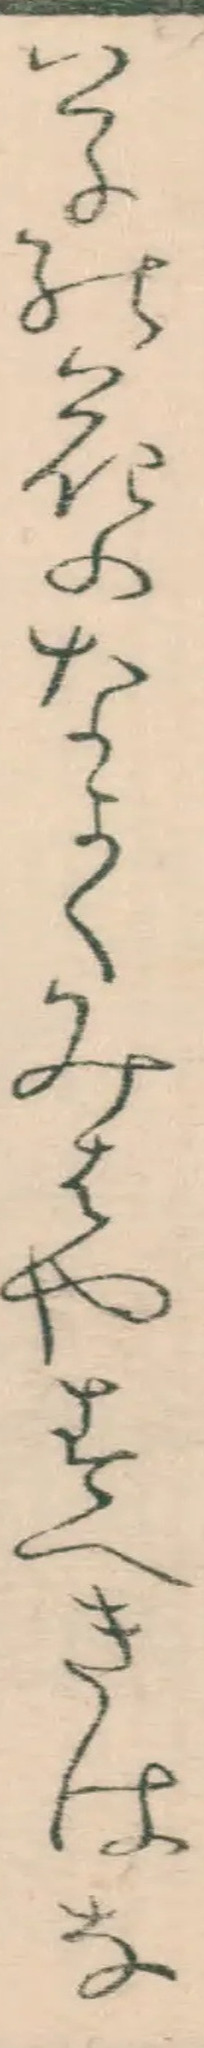草の花のなよくみはやすへきはな
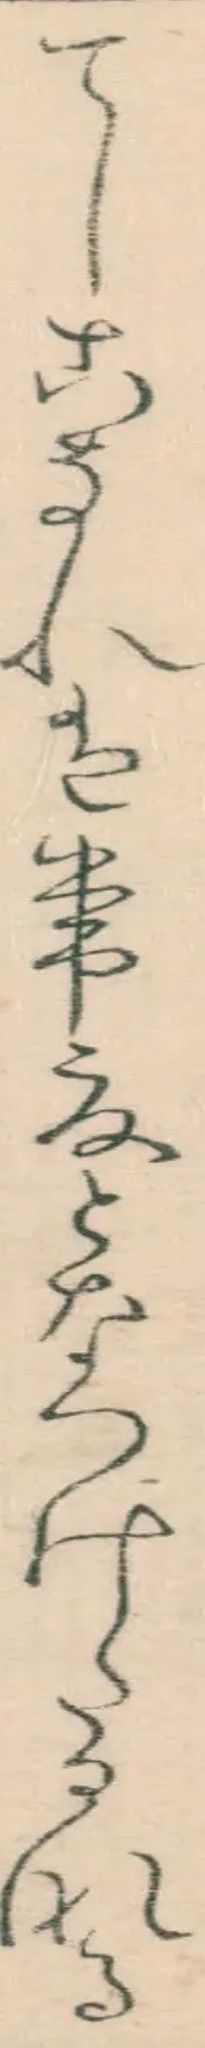てしこなれは常夏となつけたるなる
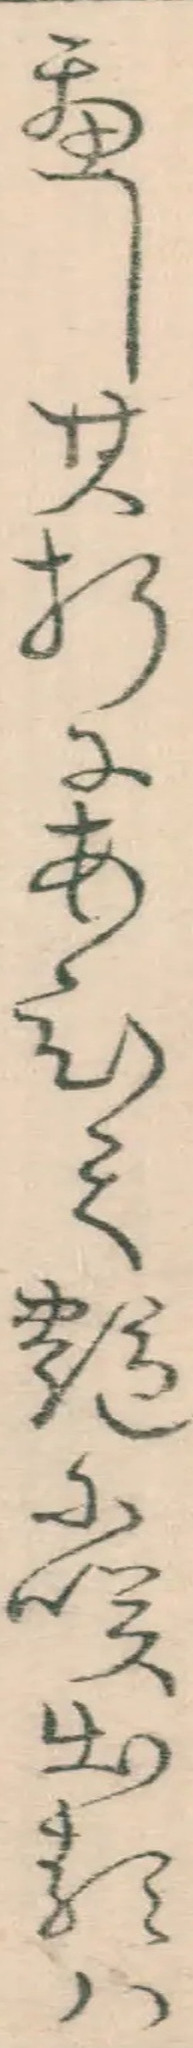へし其折にあひて艶に咲出るは
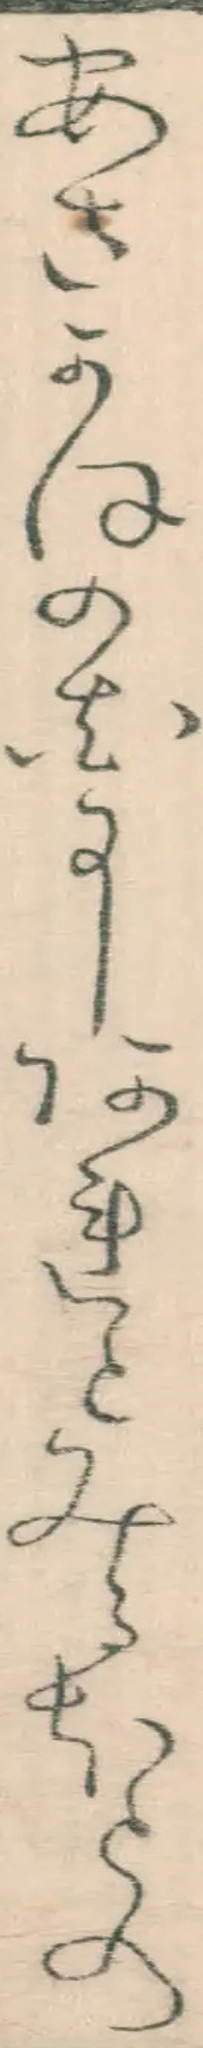あさかほの花にしあれとみるほとの
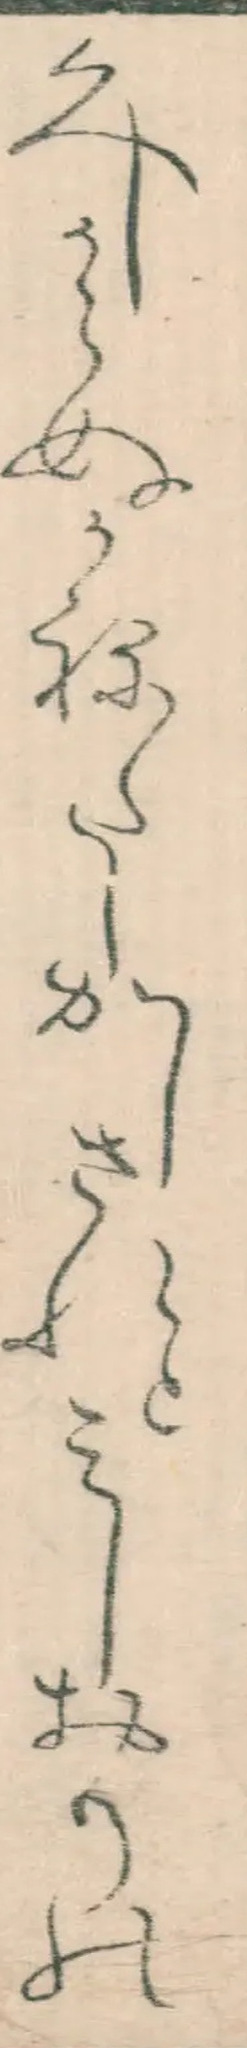久しからぬかねたしかしされとみしおりの
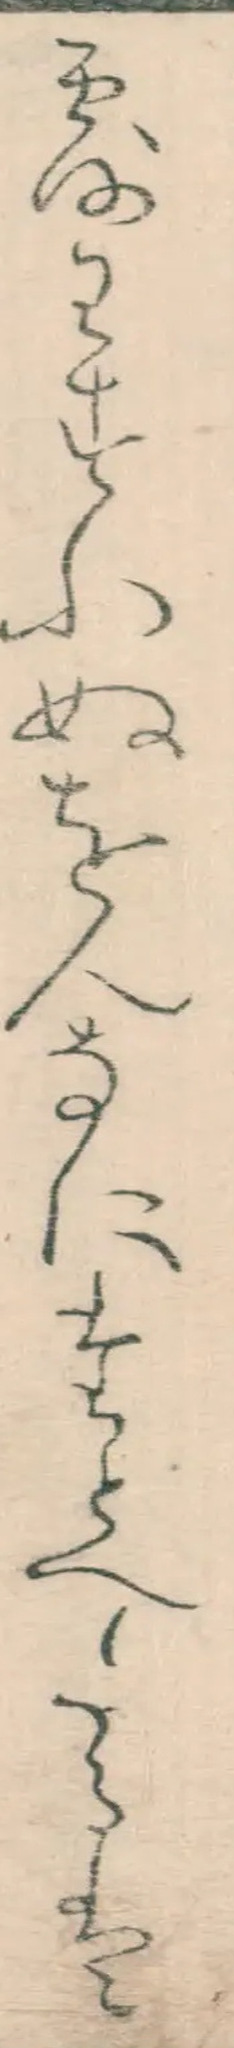露わすれぬをんなにたとへたるは
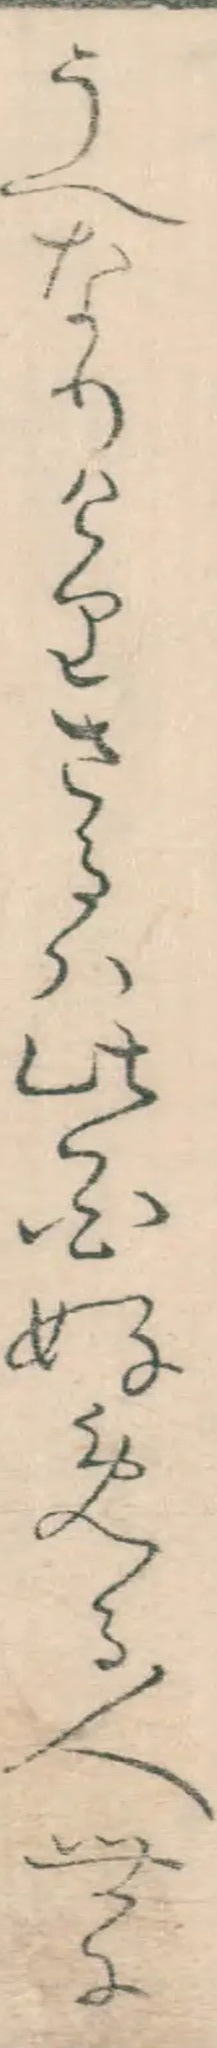うへなりけりさるは此花好める人世に
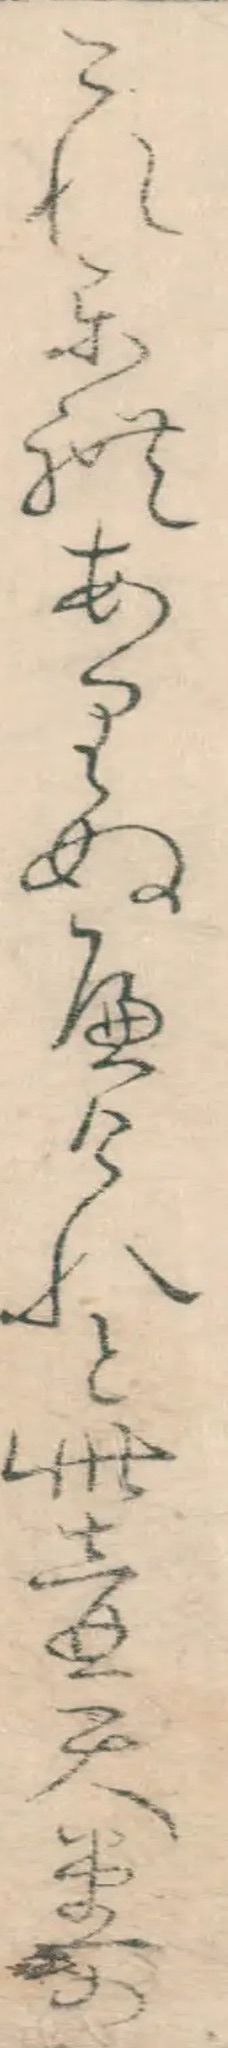これかれありぬへけれと此壷天堂の

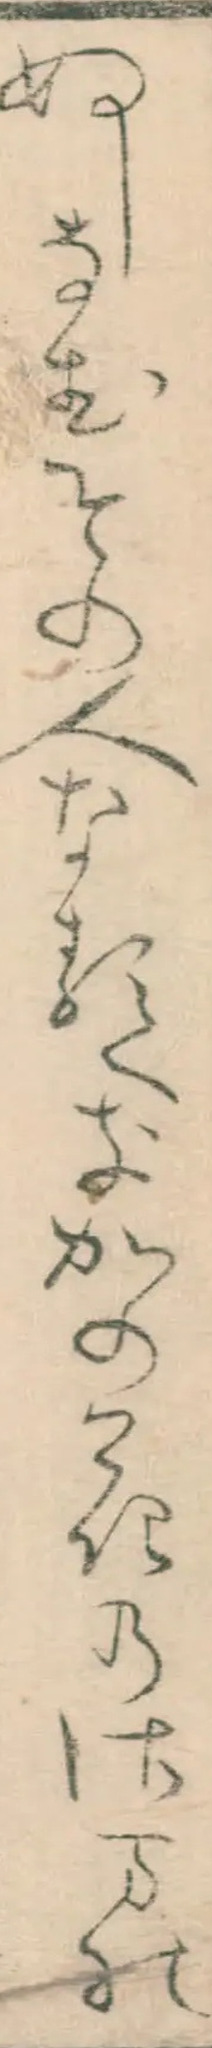ぬしなむその人なるへきかの花のさまの
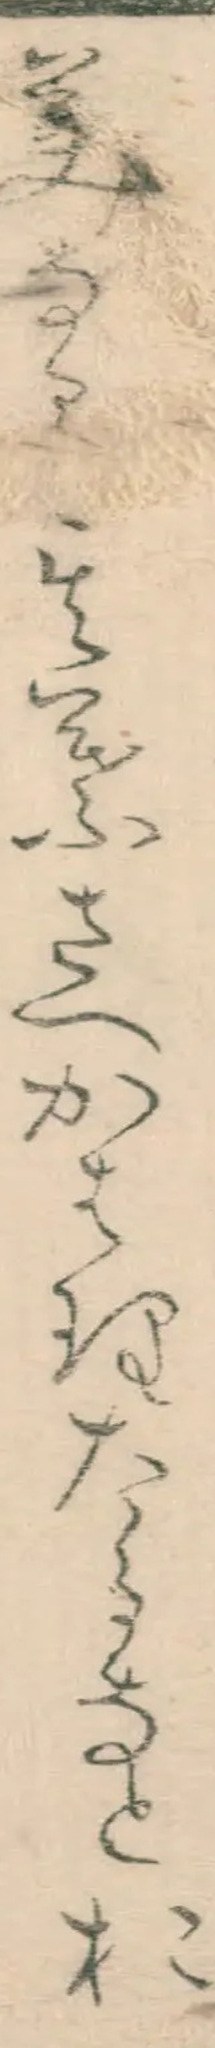美なり其葉さへかはりたるなとお
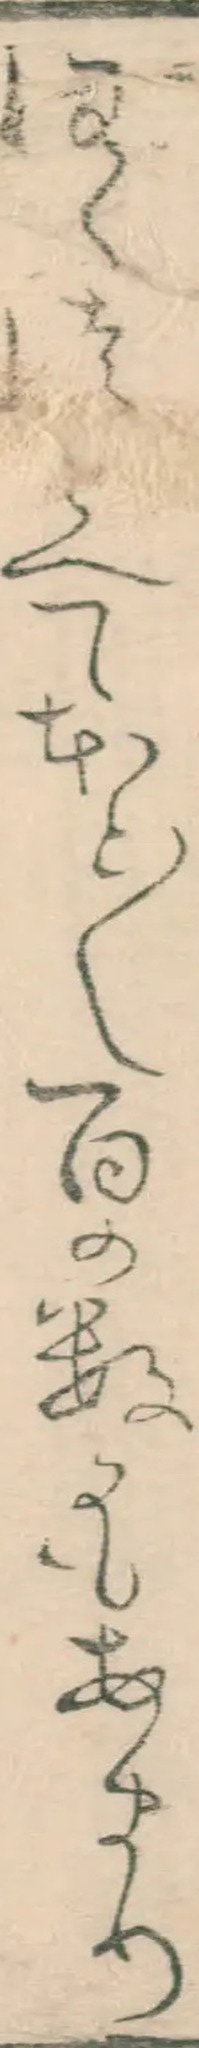ほくつたへてほと〳〵百の数にもあまり
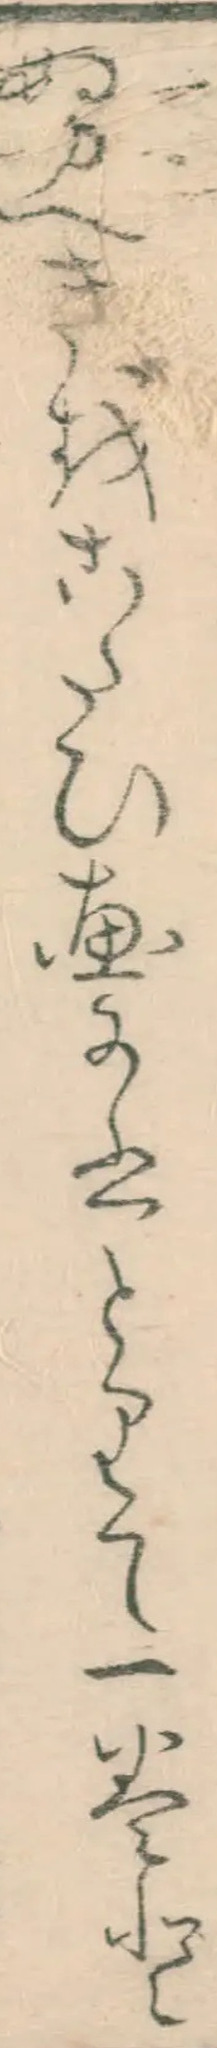ぬゆへきをこたひ画に書とりて一巻と
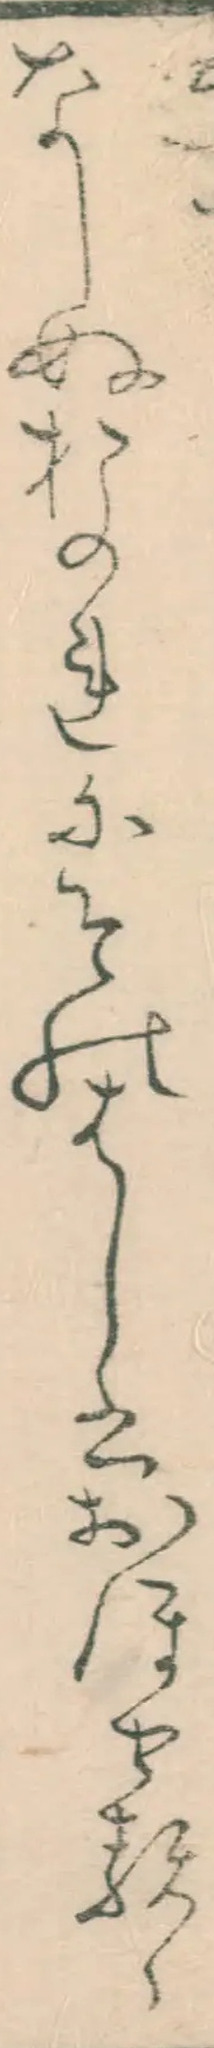なしぬおのれにそのはし書おほせるゝ
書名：花壇朝顔通 2巻. [1]
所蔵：国立国会図書館 National Diet Library, JAPAN
